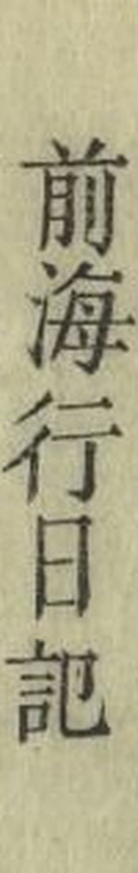前海行日記
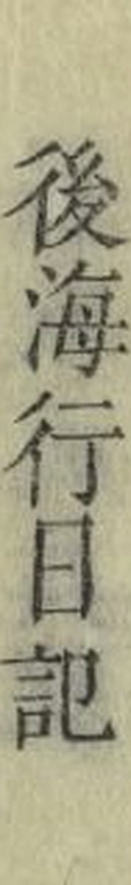後海行日記
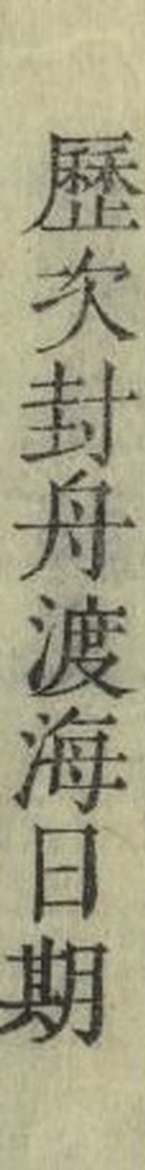歷次封舟渡海日期

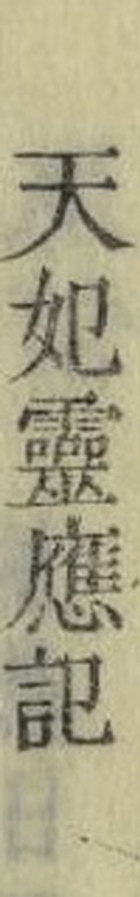天妃靈應記
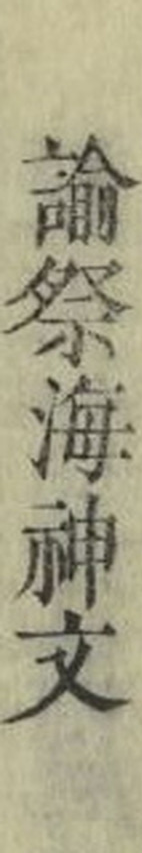諭祭海神文
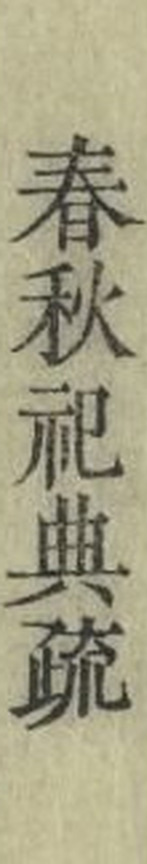春秋祀典疏
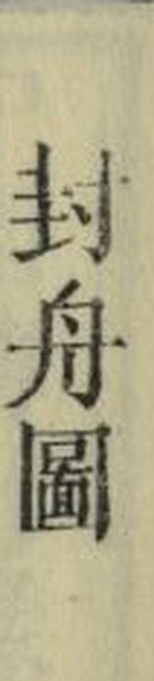封舟圖

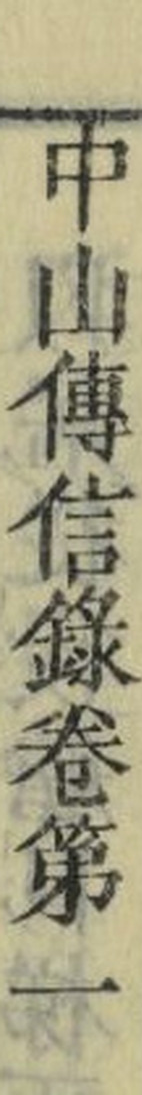中山傳信錄卷第一
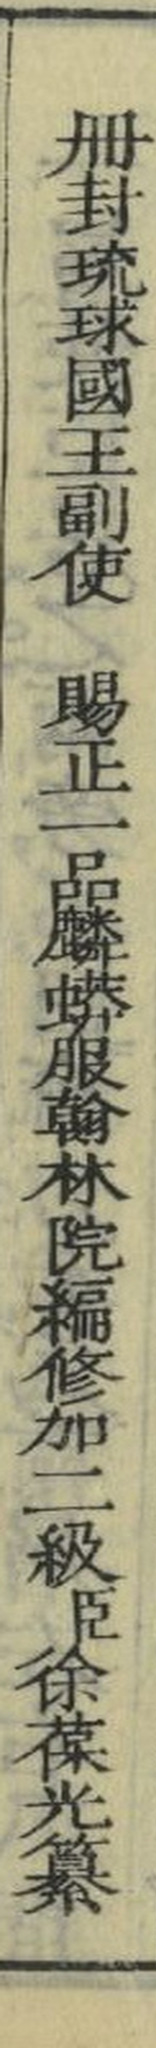冊封琉球國王副使賜正一品麟蟒服翰林院編修加二級臣徐葆光纂
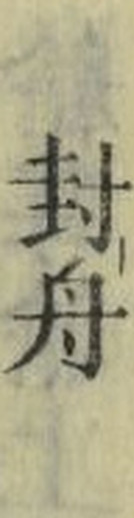封-舟
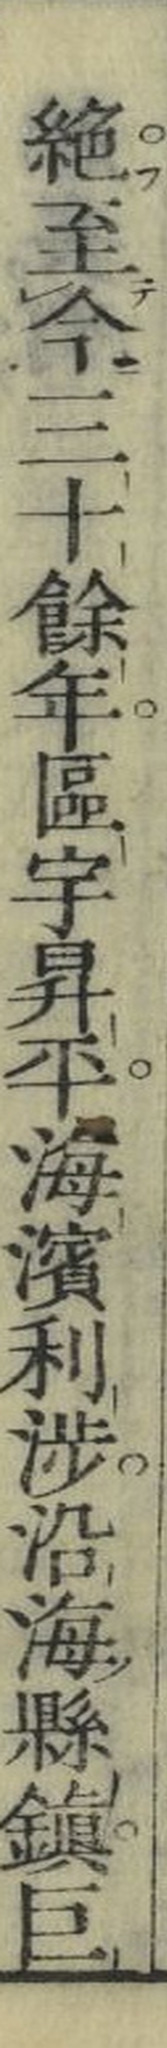絶。至今三-十-餘-年。區-宇昇-平。海-濱利-涉。沿-海縣-鎭。巨-

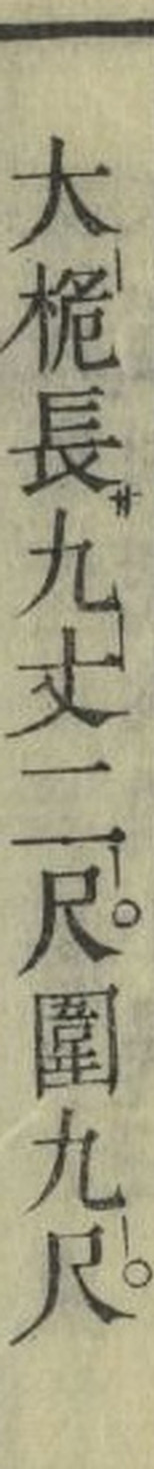大-桅長九-丈二-尺。圍九-尺。
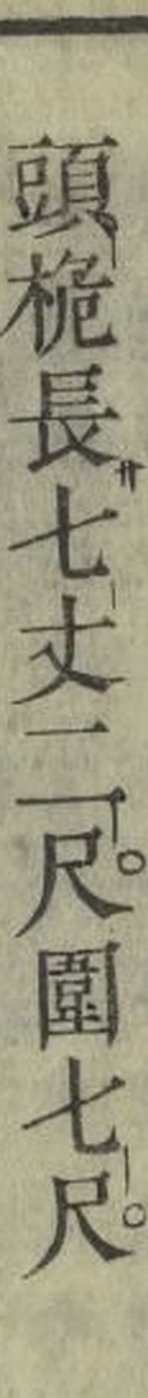頭-桅長七-丈二-尺。圍七-尺。
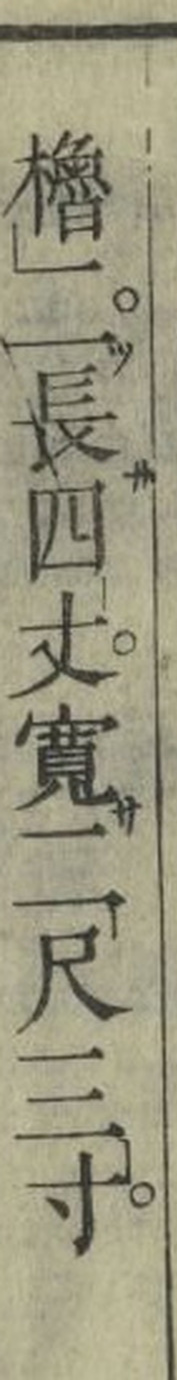櫓-二。長四-丈。寬二-尺三-寸。
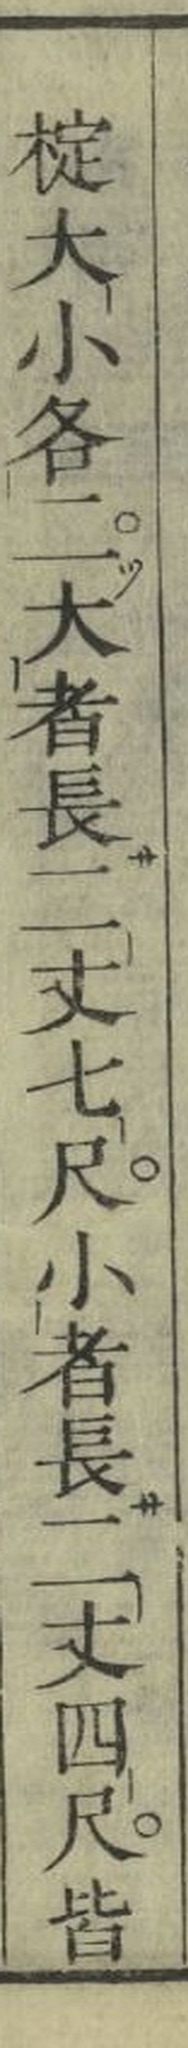椗大-小各-二。大-者長二-丈七-尺。小-者長二-丈四-尺。皆
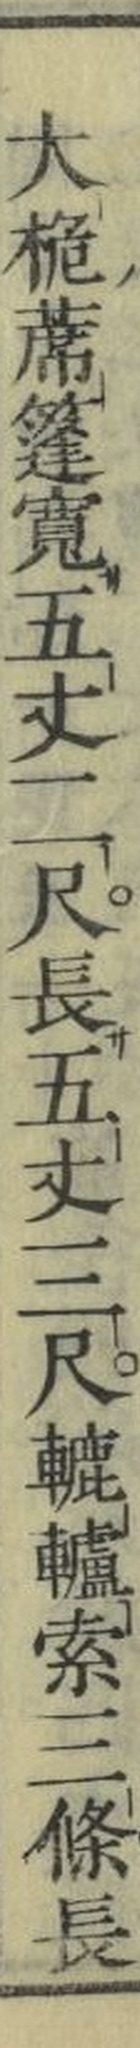大-桅蓆-篷寬五-丈二-尺。長五-丈三-尺。轆-轤-索三-條。長
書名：中山伝信録 巻一
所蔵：University of the Ryukyus Library
